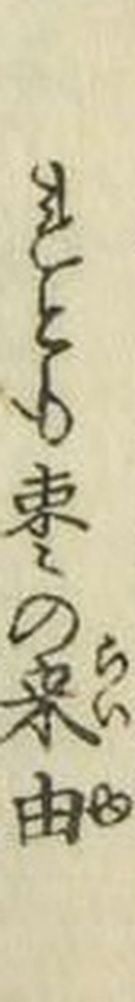れとも棗の来由
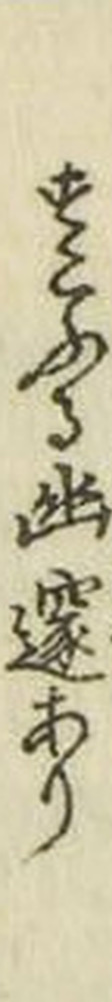すこふる幽邃あり
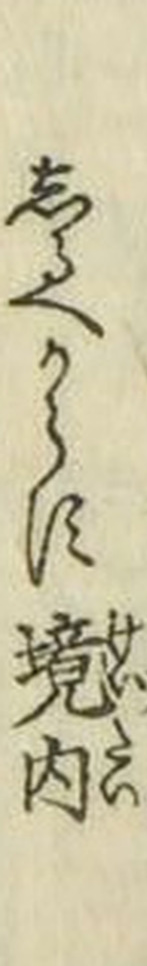しるへからす境内

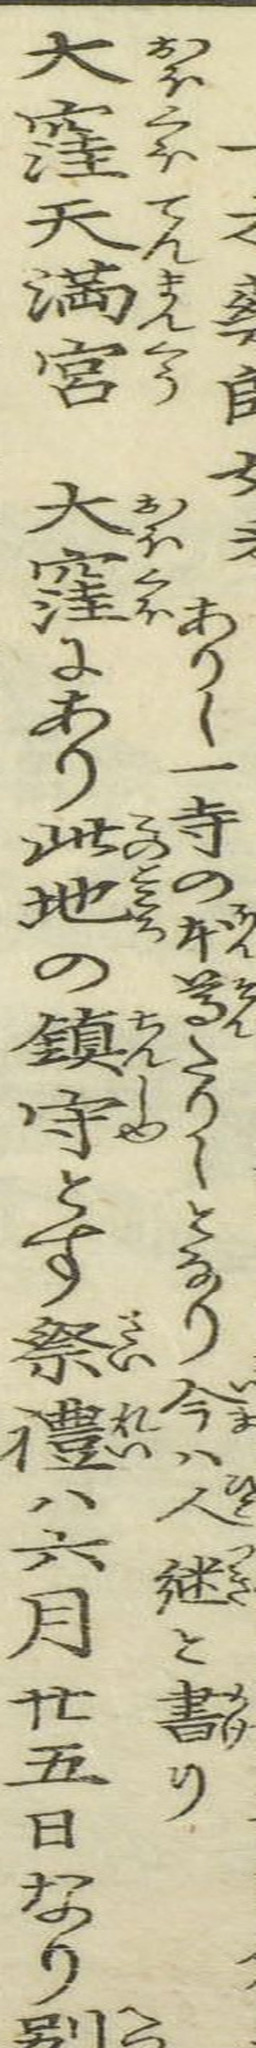大窪天満宮大窪にあり此地の鎮守とす祭礼は六月廿五日なり別
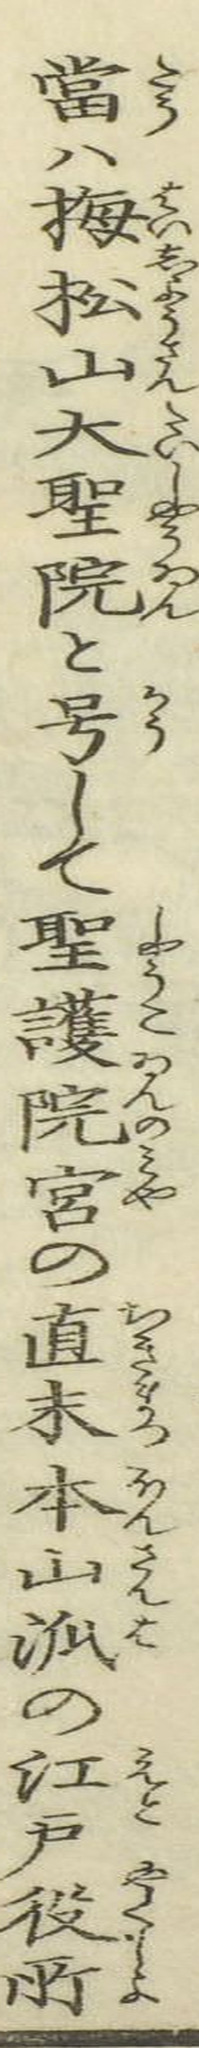当は梅松山大聖院と号して聖護院宮の直末本山派の江戸役所
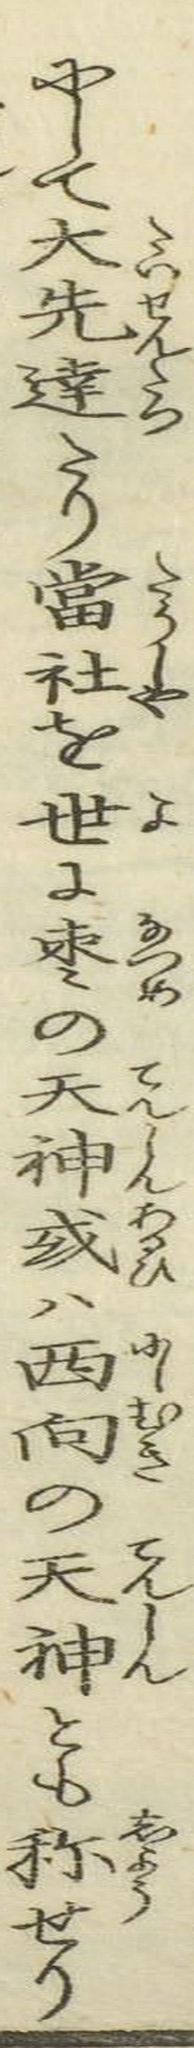にして大先達たり当社を世に棗の天神或は西向の天神とも称せり
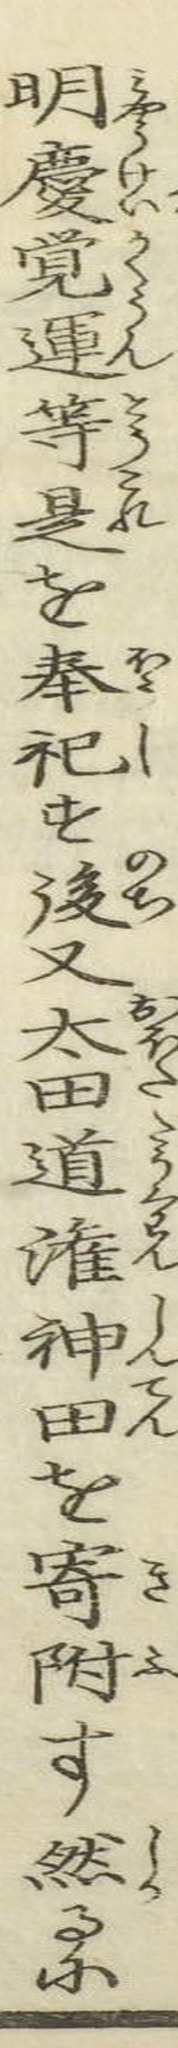明慶覚運等是を奉祀す後又太田道灌神田を寄附す然るに
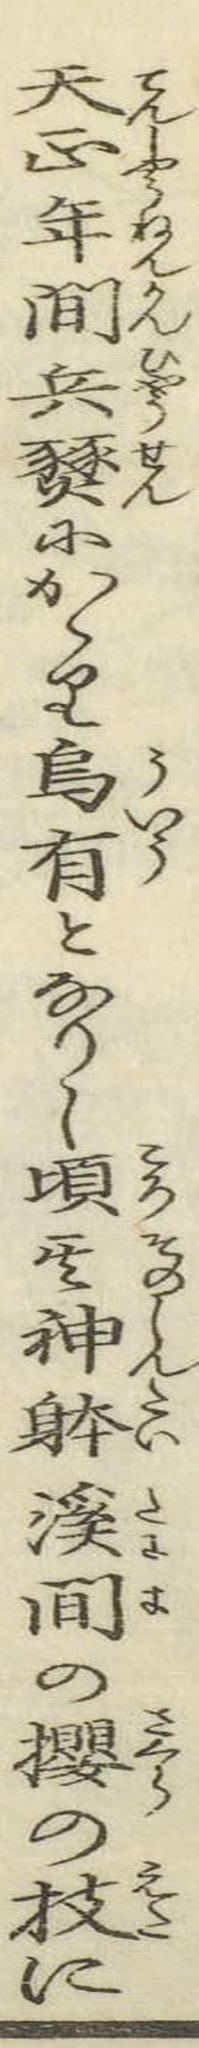天正年間兵燹にかゝり烏有となりし頃其神体渓間の桜の枝に
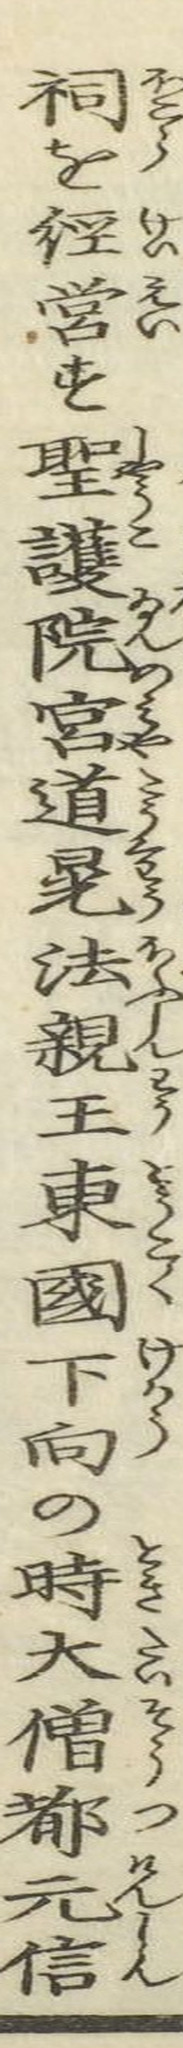祠を経営す聖護院宮道晃法親王東国下向の時大僧都元信
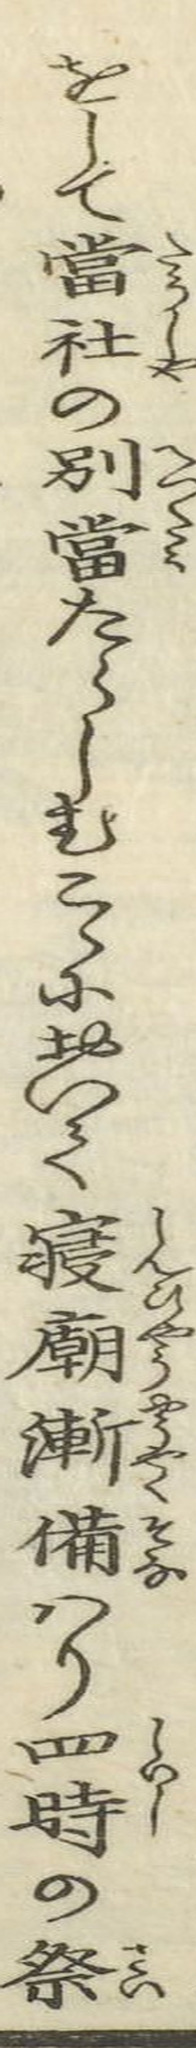をして当社の別当たらしむこゝにおいて寝廟漸備はり四時の祭
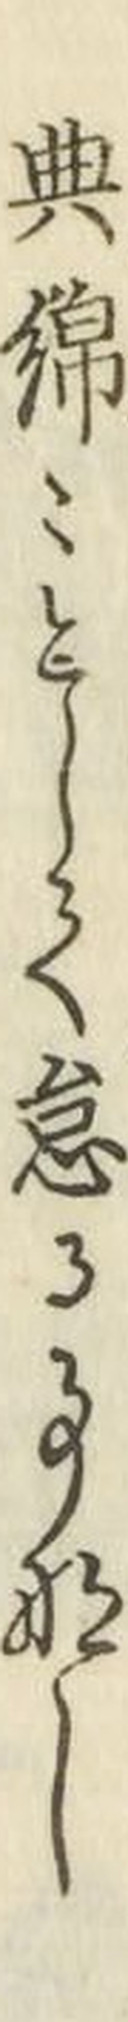典綿々として怠る事なし
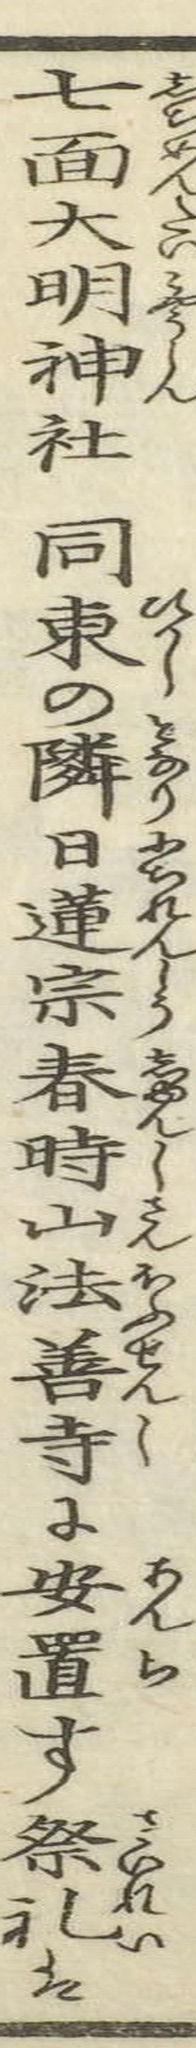七面大明神社同東の隣日蓮宗春時山法善寺に安置す祭礼は
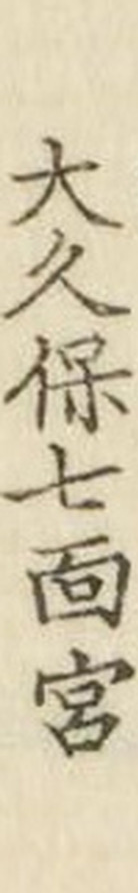大久保七面宮

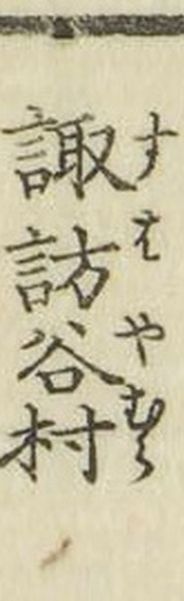諏訪谷村
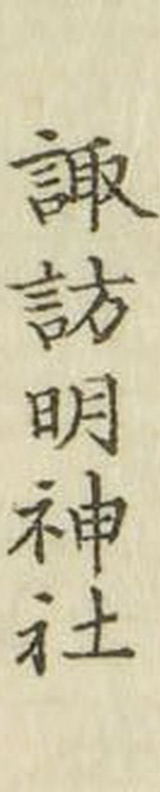諏訪明神社

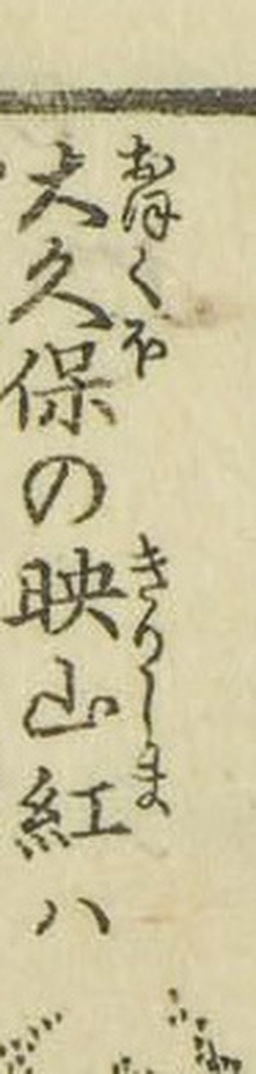大久保の映山紅は
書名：江戸名所図会 20巻 巻之11
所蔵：東京学芸大学教育コンテンツアーカイブ
